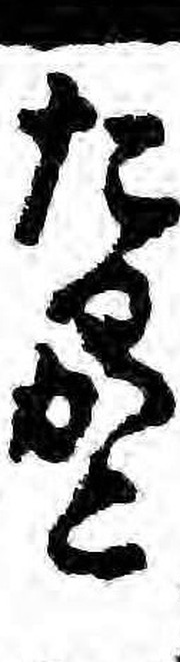たるかと
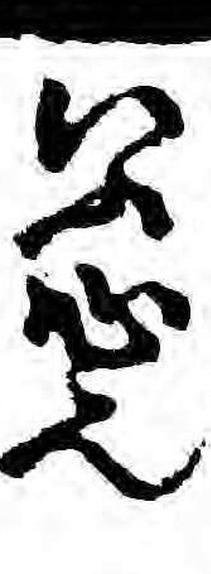いふ心也
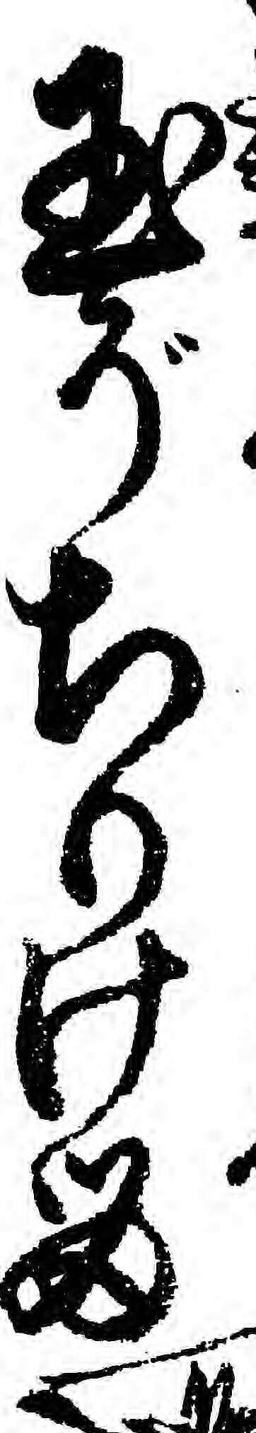玉ぞちりける

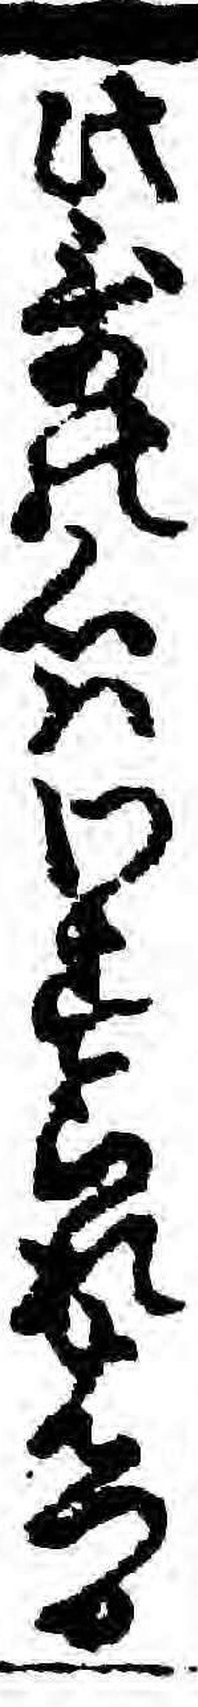此哥の心はわすられはつる
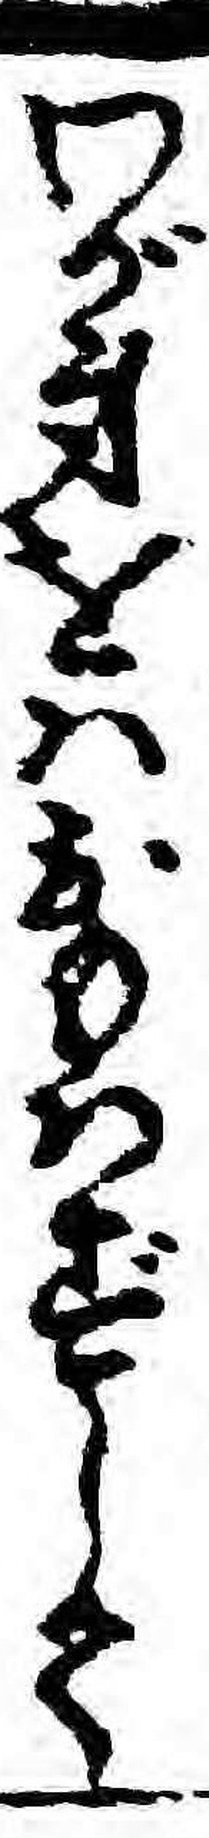わが身をはおもはずして
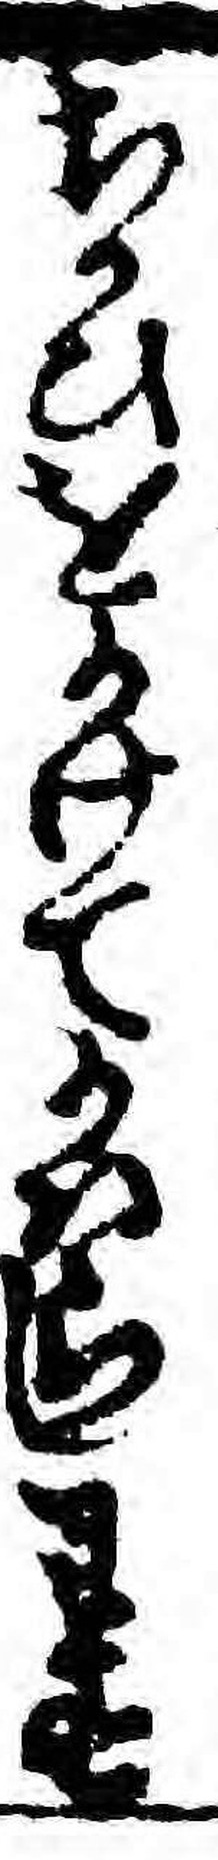ちかいをうけてかはらしわす
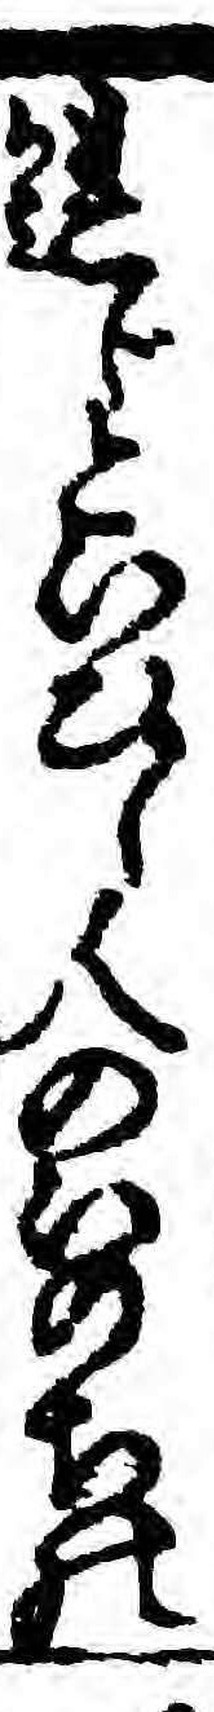れじといひし人のいのちの
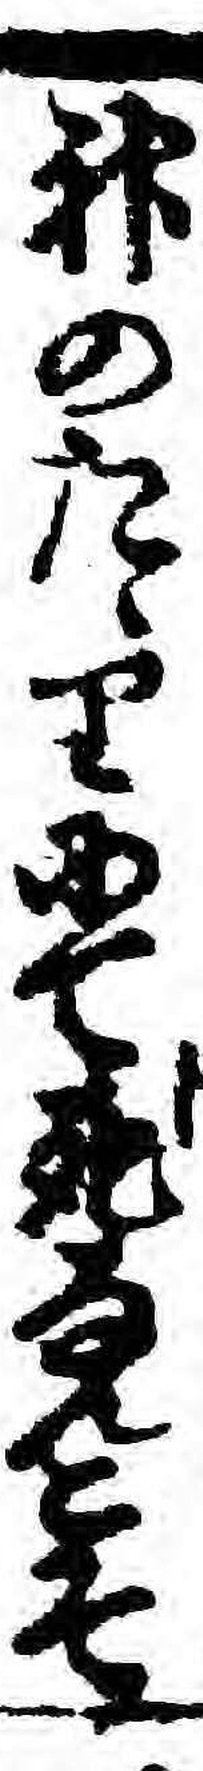神のたゝりにて死なんこそ
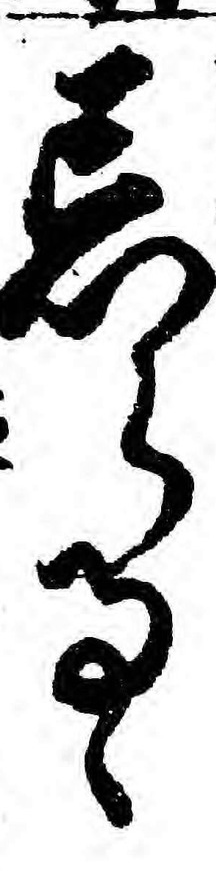忘らるゝ
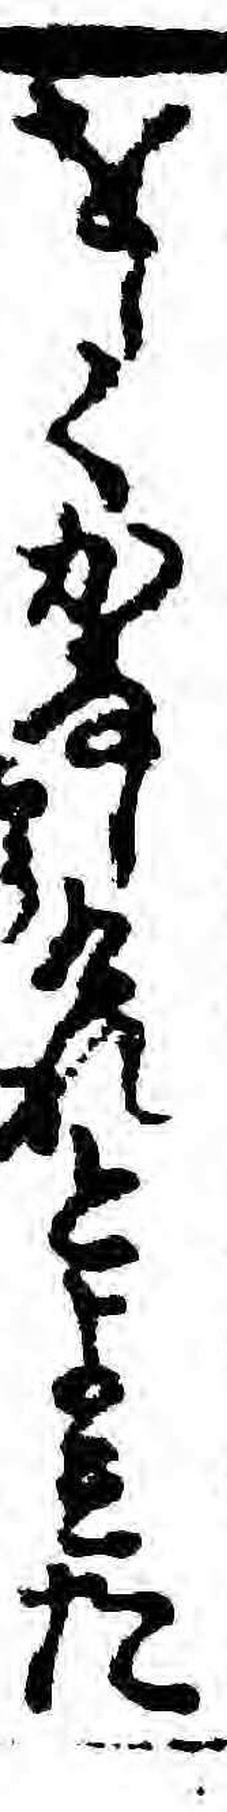おしくかなしけれとよみた
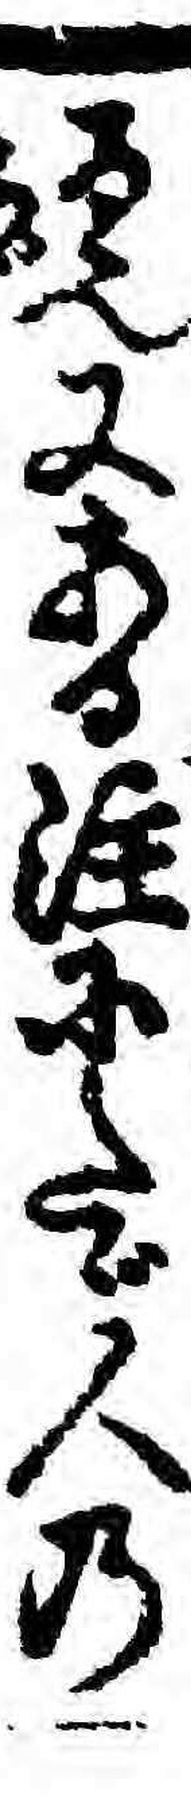る也又ある注にたゞ人の
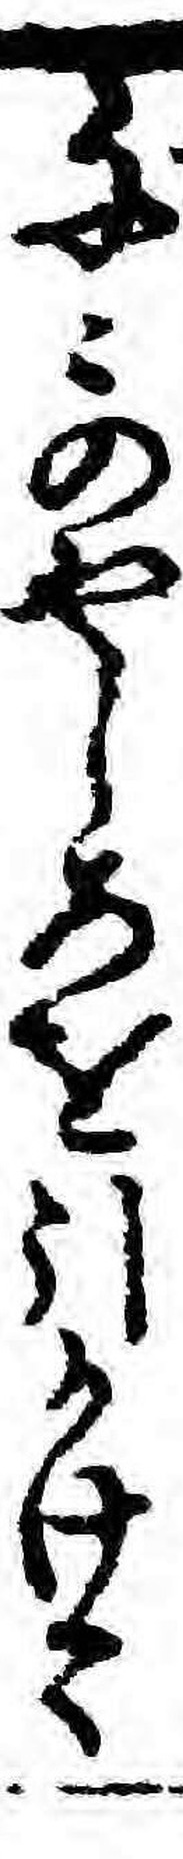千々のやしろを引きかけて
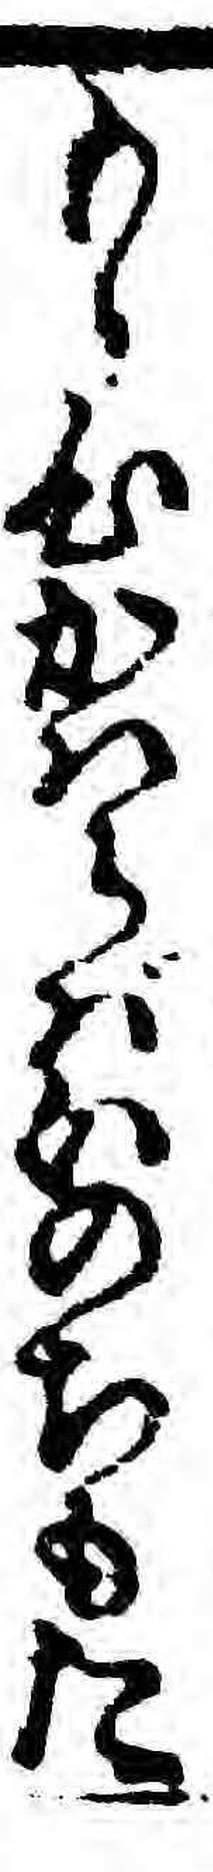もし心かはらばいのちもた
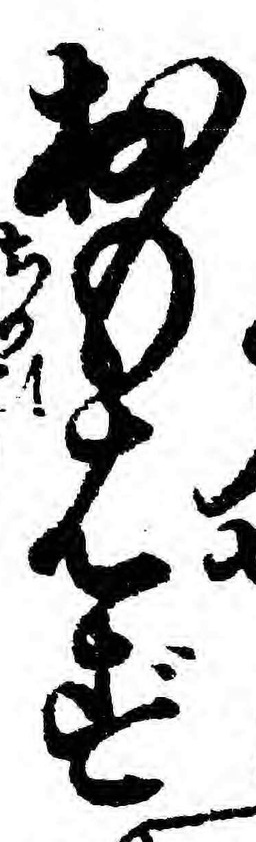おもはず
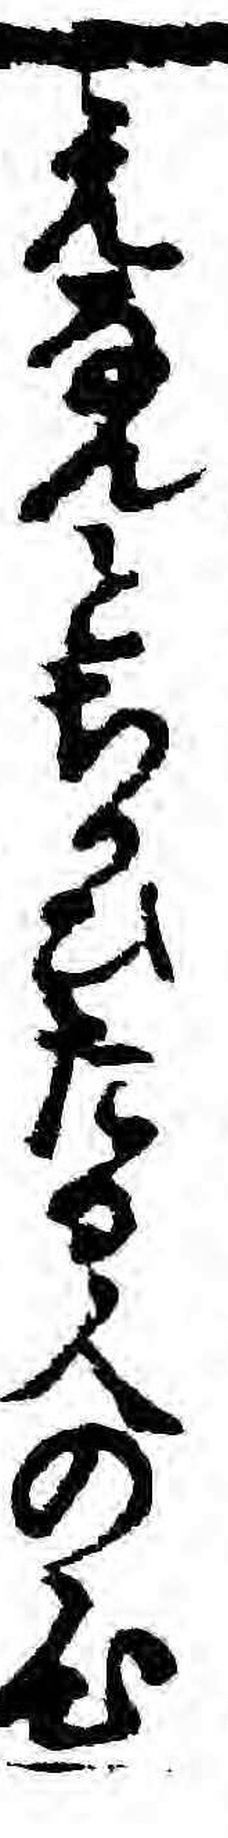えなんとちかひたる人の心
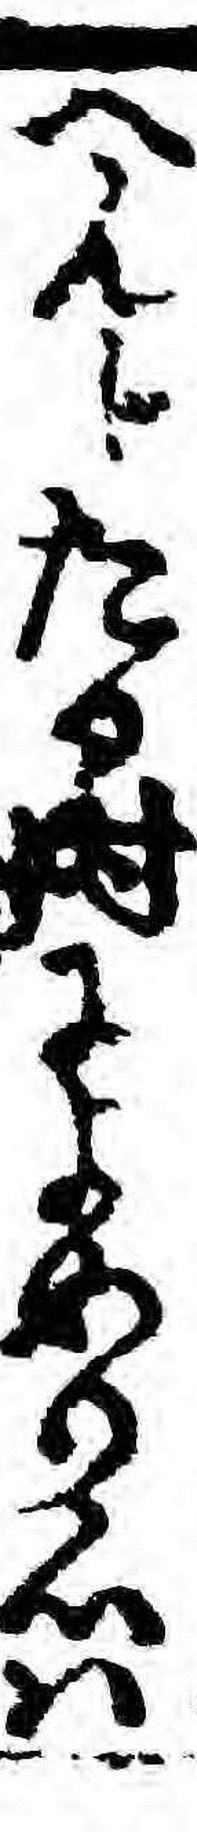へんじたる時によめり心は
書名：頭書和歌注譯／壽賀多百人一首小倉錦
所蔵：国文学研究資料館
